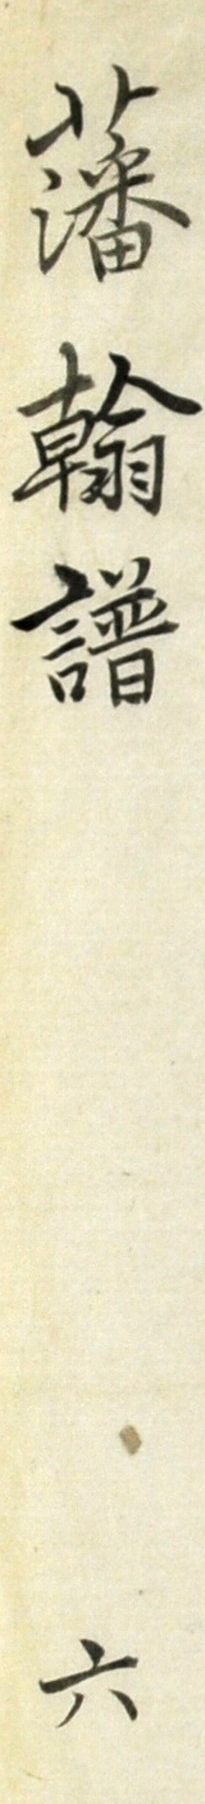藩翰譜六

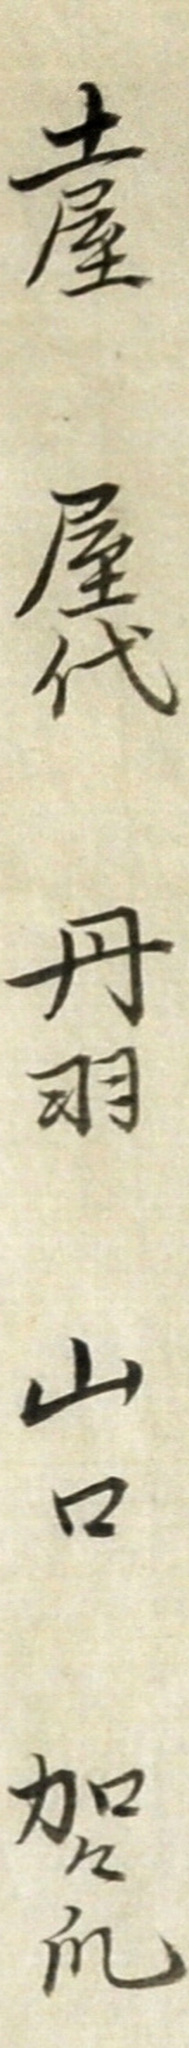土屋屋代丹羽山口加々爪
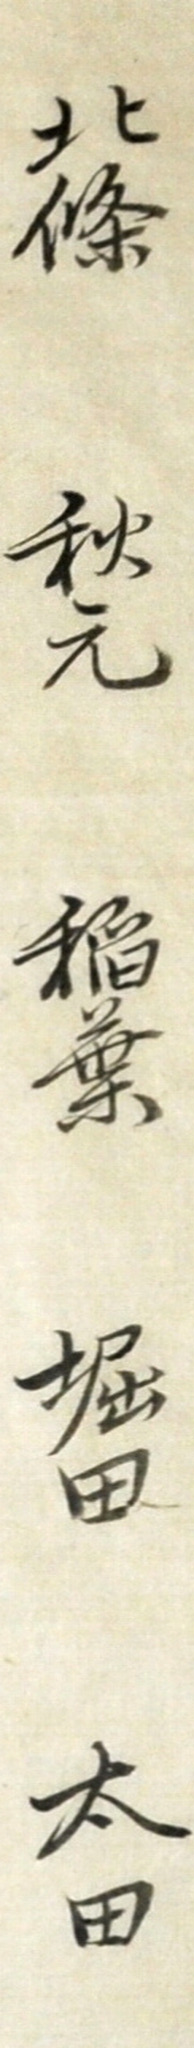北条秋元稲葉堀田太田
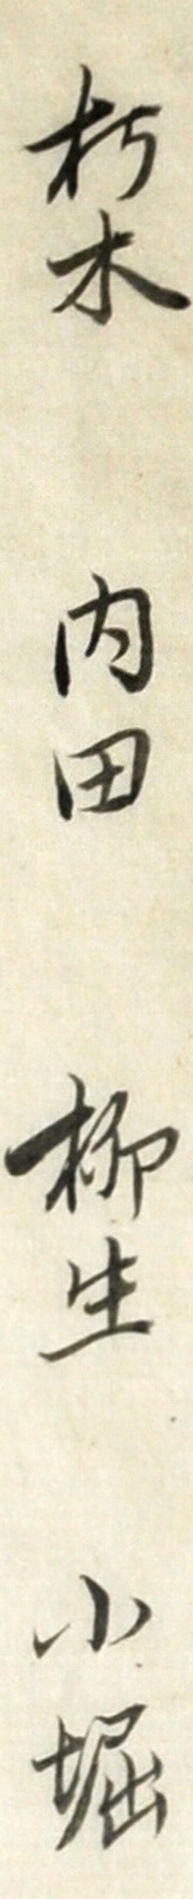朽木内田柳生小堀
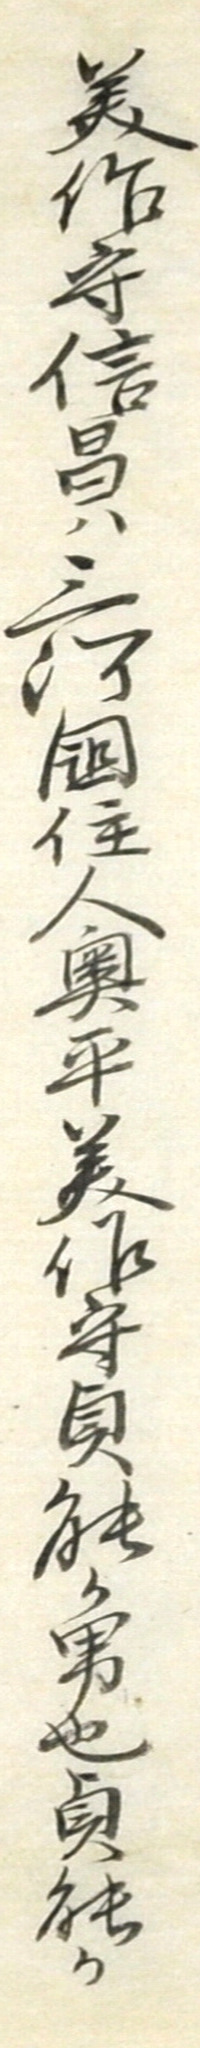美作守信昌は三河国住人奥平美作守貞能か男也貞能か
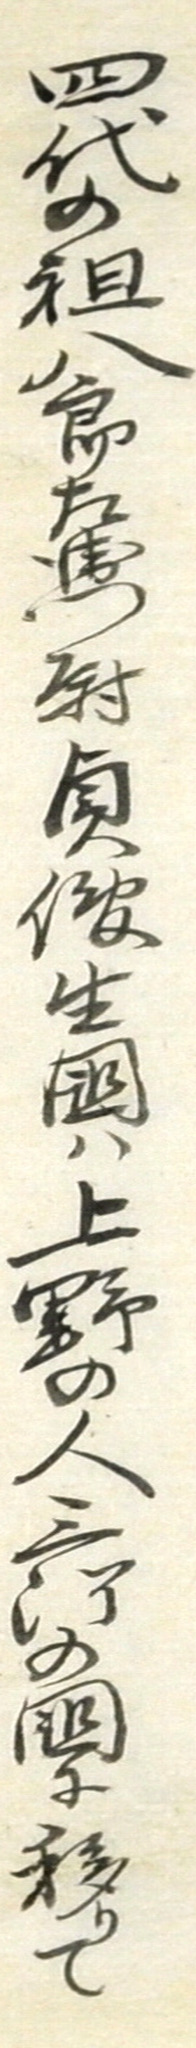四代の祖八郎左衛門尉貞俊生国は上野の人三河の国に移りて

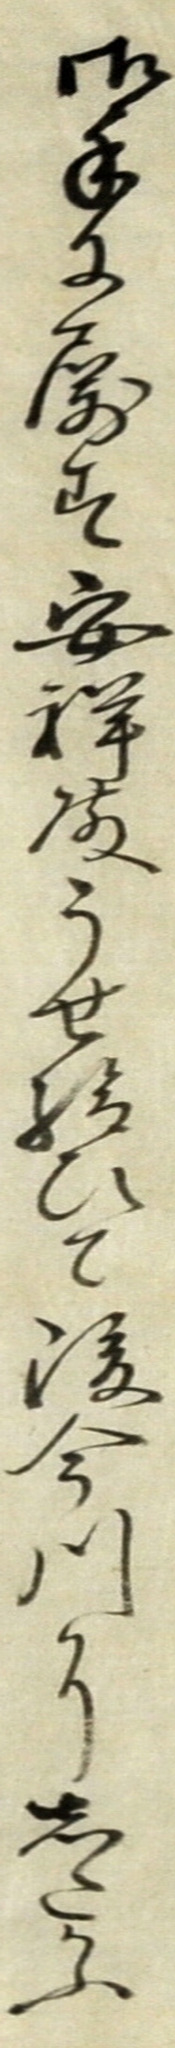御手に属す安祥殿うせ給ひて後今川にしたかふ
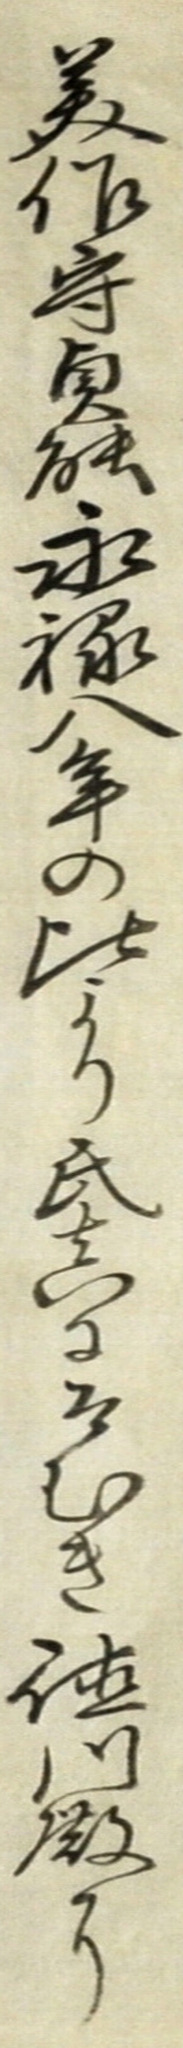美作守貞能永禄八年の比より氏真にそむき徳川殿に
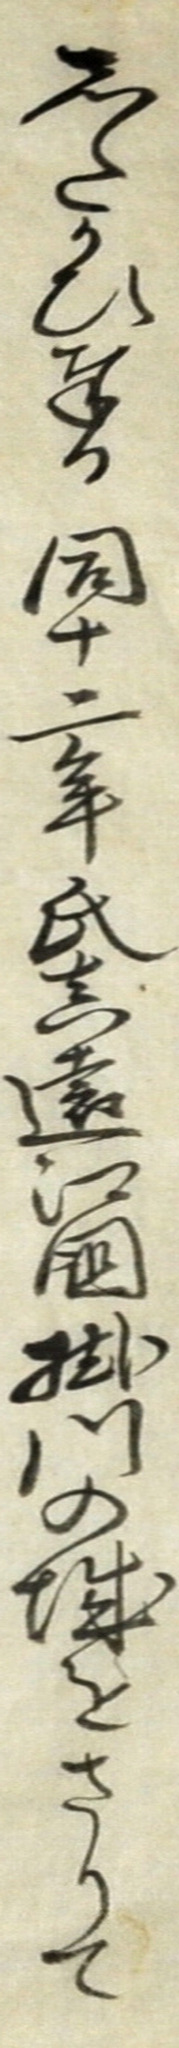したかひ奉り同十二年氏真遠江国掛川の城をさりて
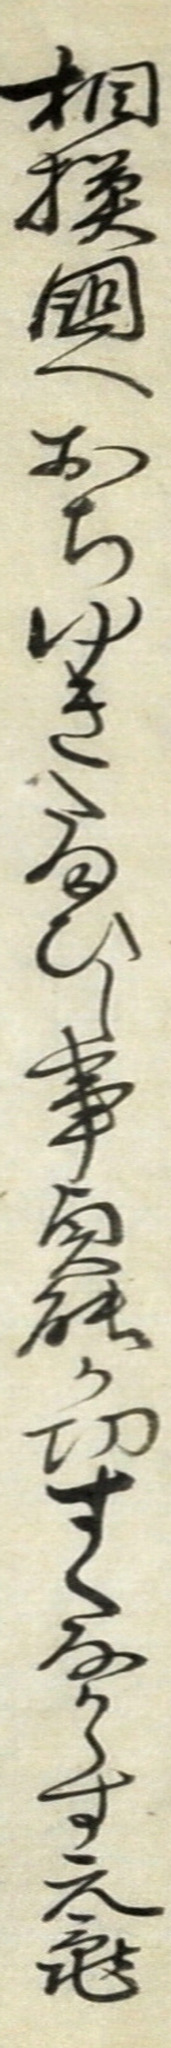相模国へおちゆきたまひし事貞能か功すくなからす元亀
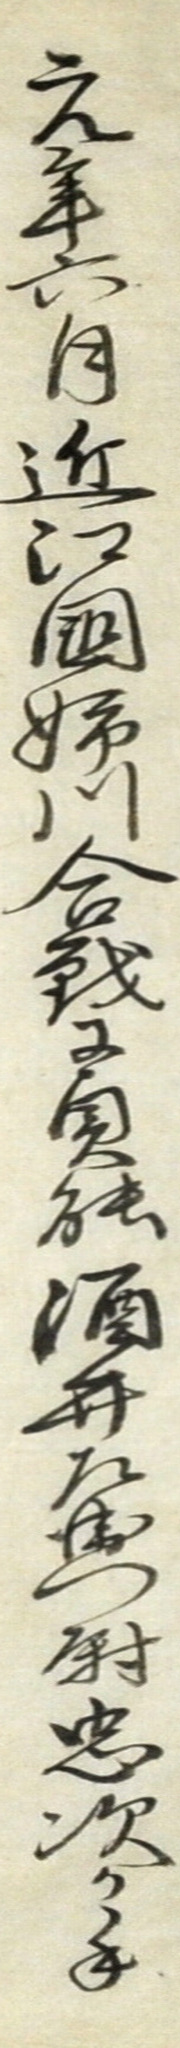元年六月近江国姉川合戦に貞能酒井左衛門尉忠次か手
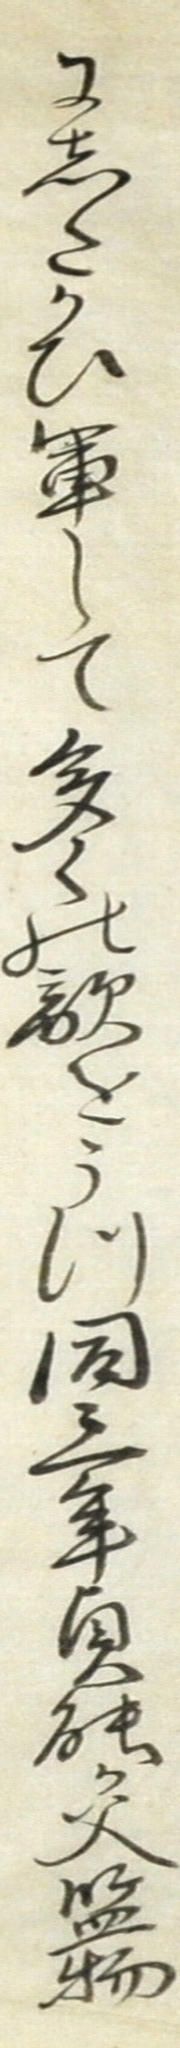にしたかひ軍して多くの敵をうつ同三年貞能か父監物
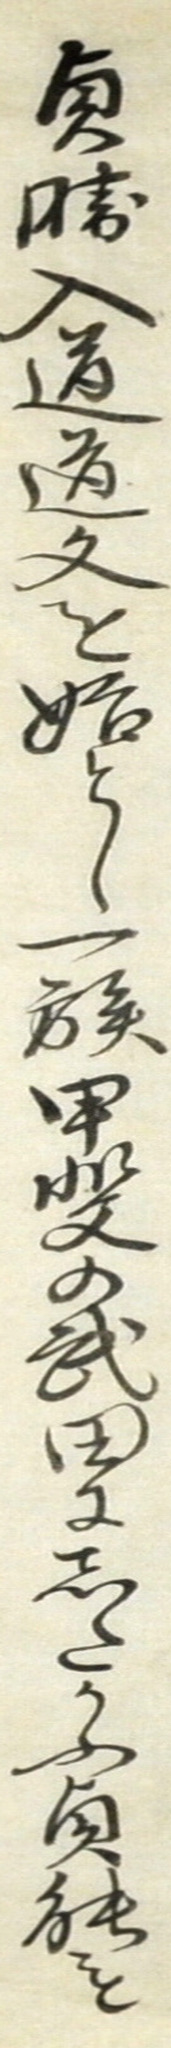貞勝入道道文を始とし一族甲斐の武田にしたかふ貞能も
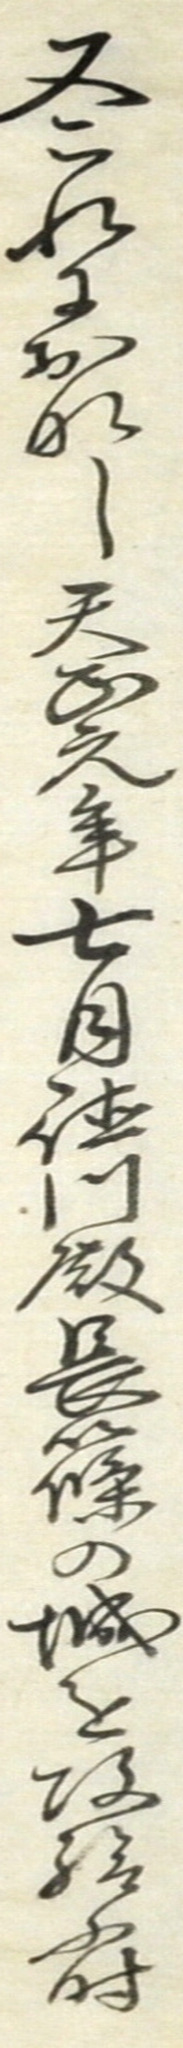又これにおなし天正元年七月徳川殿長篠の城を攻給ふ時
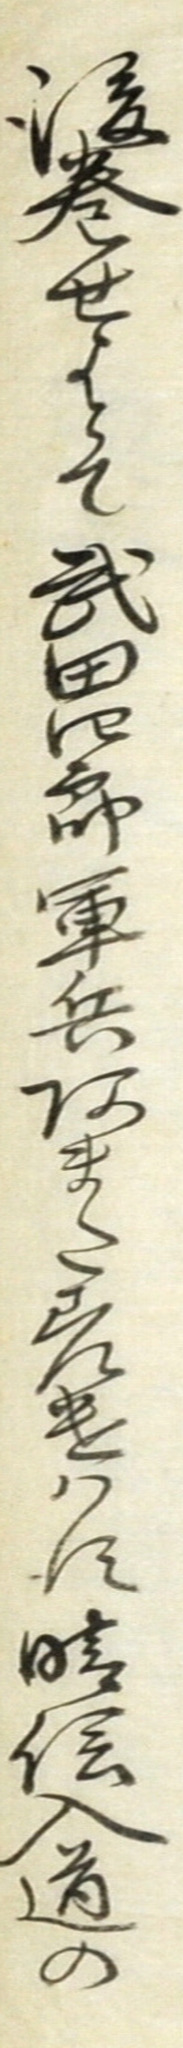後巻せよとて武田四郎軍兵あまた差遣はす晴信入道の
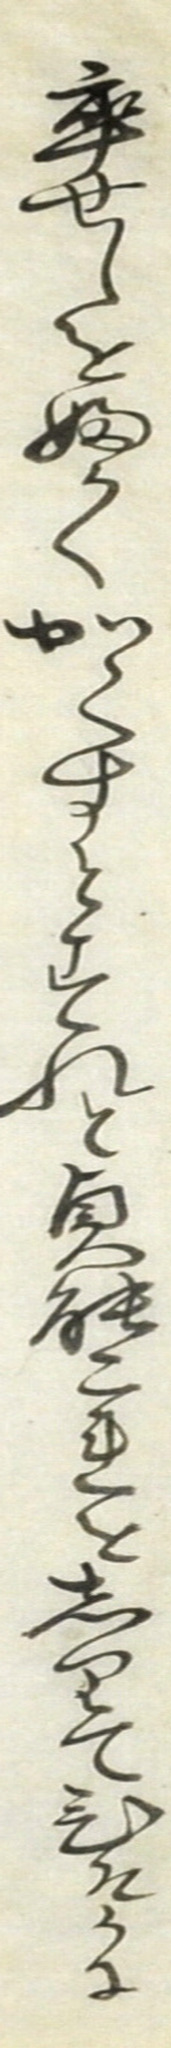卒せしをふかくかくすとすれと貞能これをしりてひそかに
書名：藩翰譜（六）
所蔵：伊那市立高遠町図書館・合同会社AMANE
